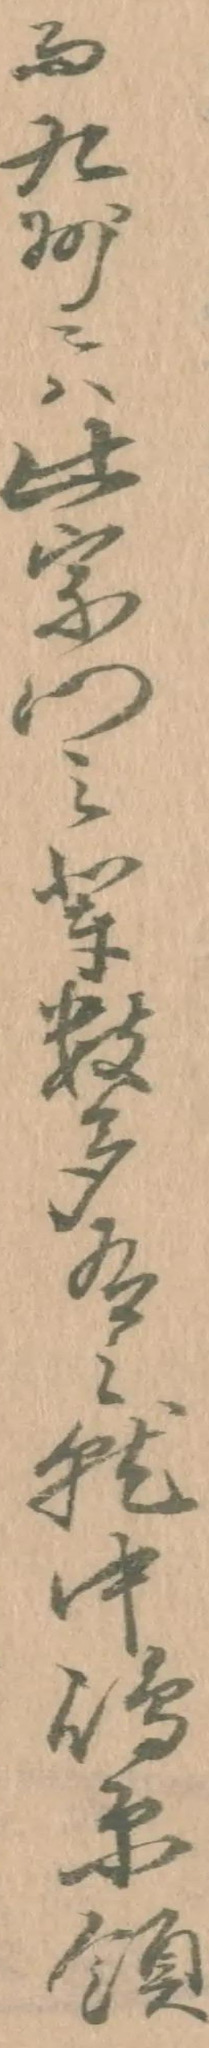而九州には此宗門之輩数多有之就中島原料領
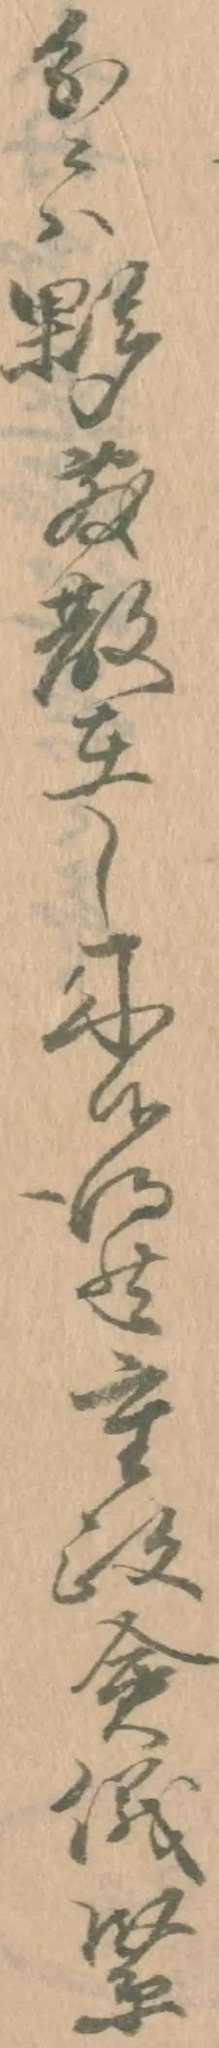分には夥敷散在し来候得共重政僉儀緊
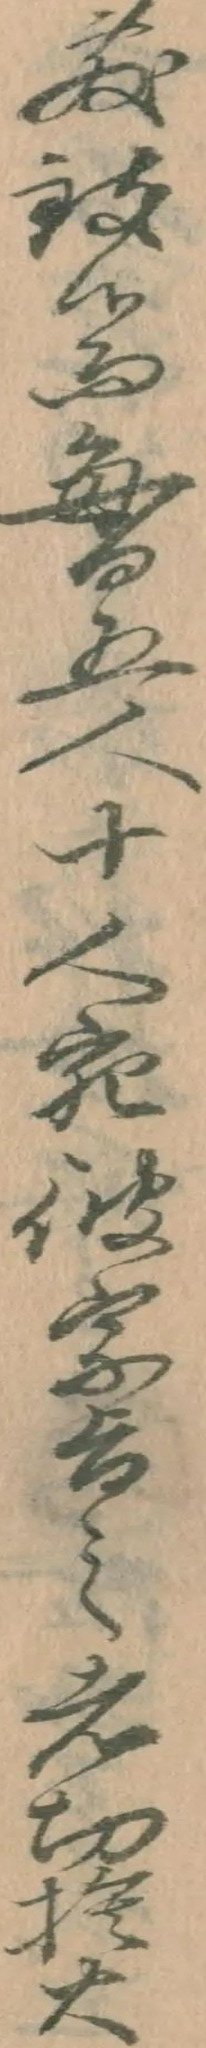敷致候而毎日五人十人宛彼宗旨之者切捨火
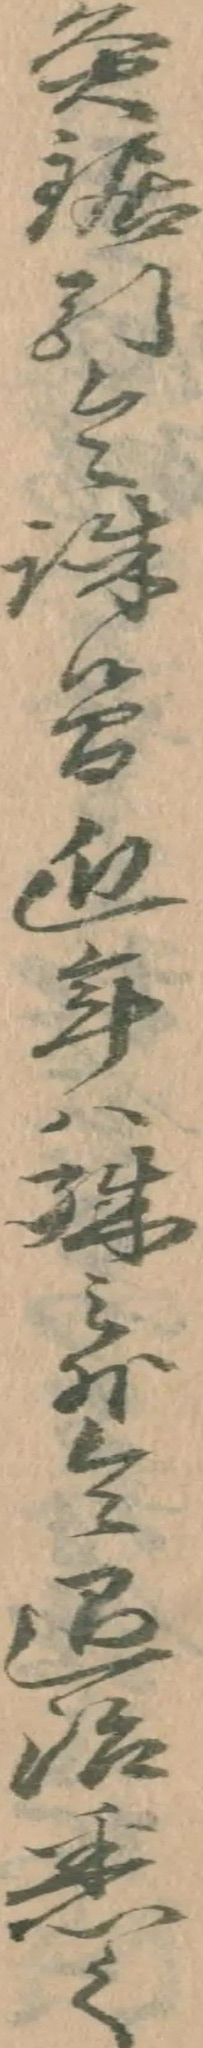灸鋸引令誅候間近年は殊之外令退治悉く
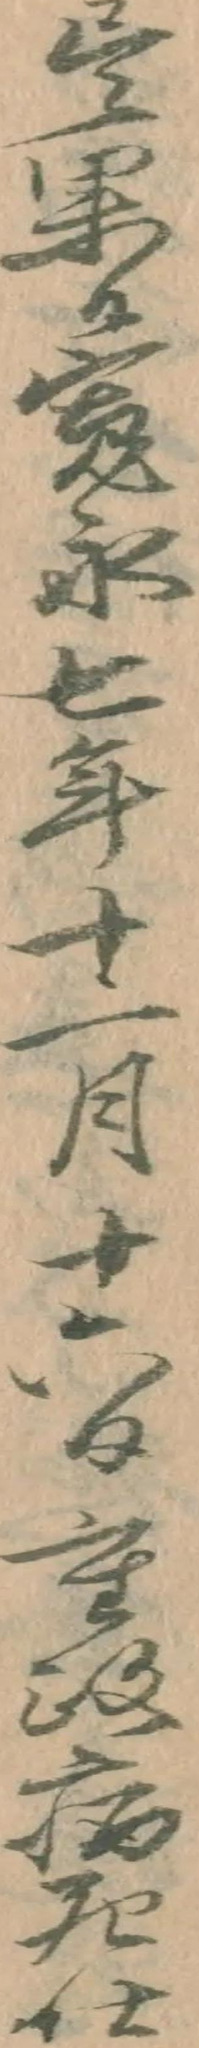尽果候寛永七年十一月十六日重政病死仕
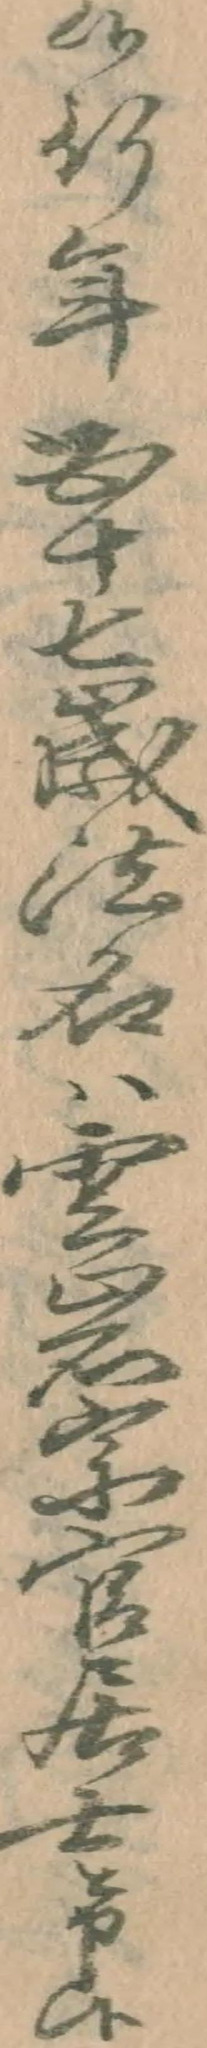候行年五十七歳法名は雲岩宗官居士と申候
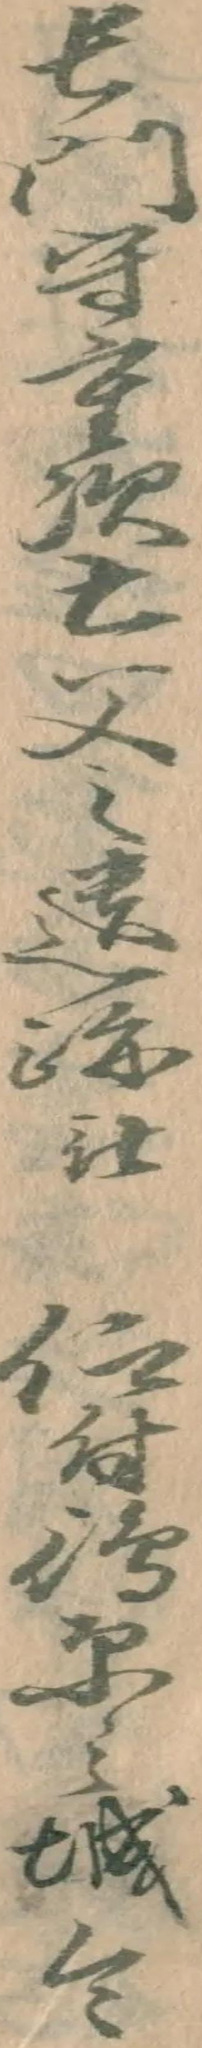長門守重次亡父之遺跡被仰付島原之城令
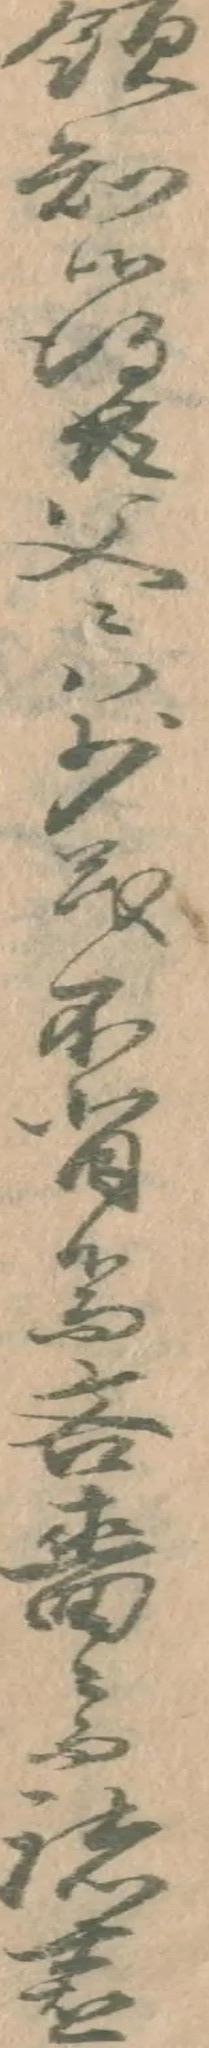領知候得共父には少も不肖候而吝嗇に而諸士を
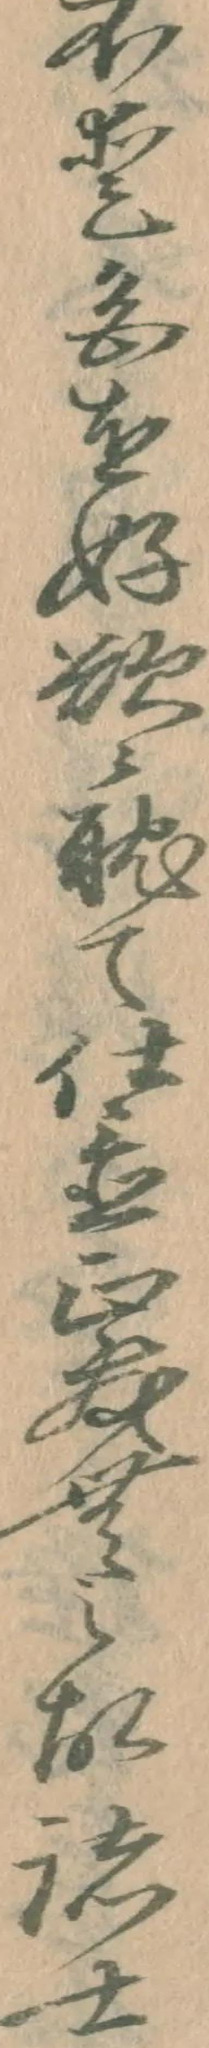不愛色を好欲に耽て仕置正敷無之故諸士
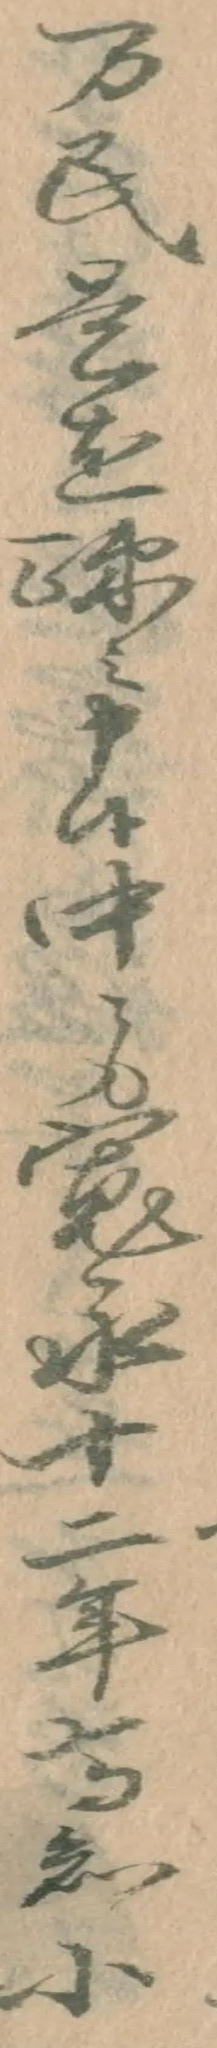万民是を疎み申候中にも寛永十二年高知小
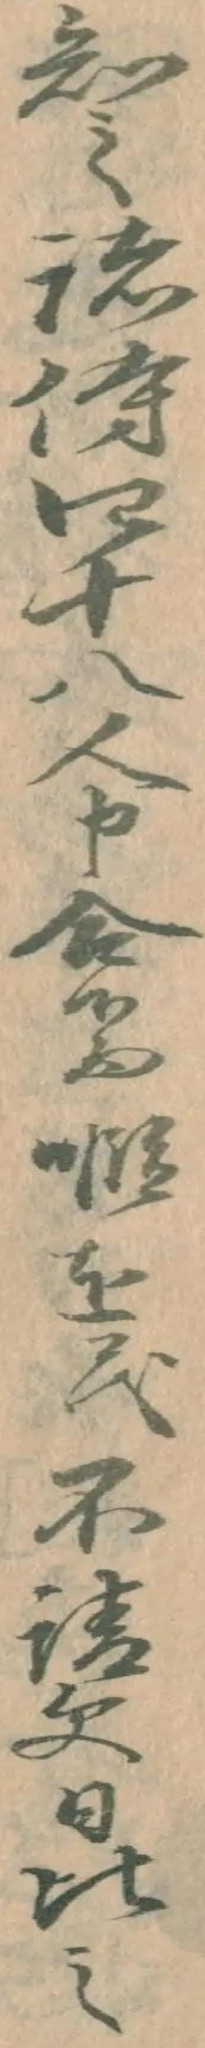知之諸侍四十八人申合候而暇をも不請欠日比之
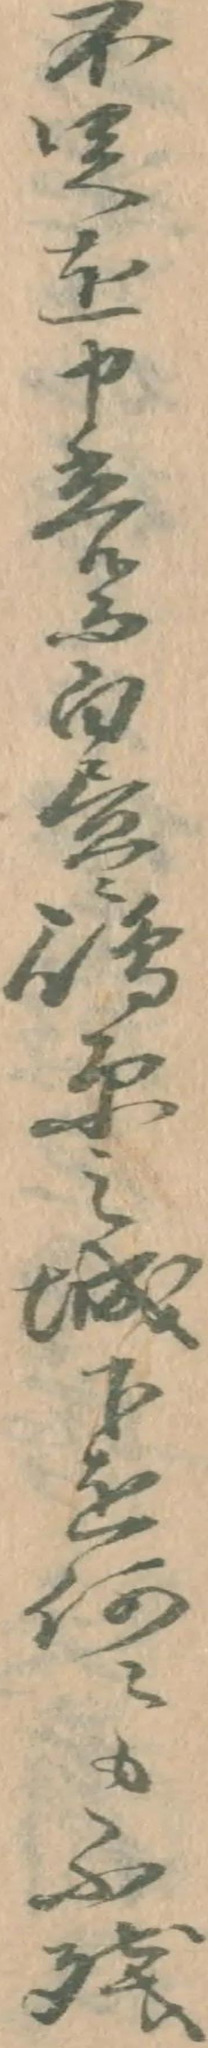不足を申立候而白昼に島原之城下を何にも不残

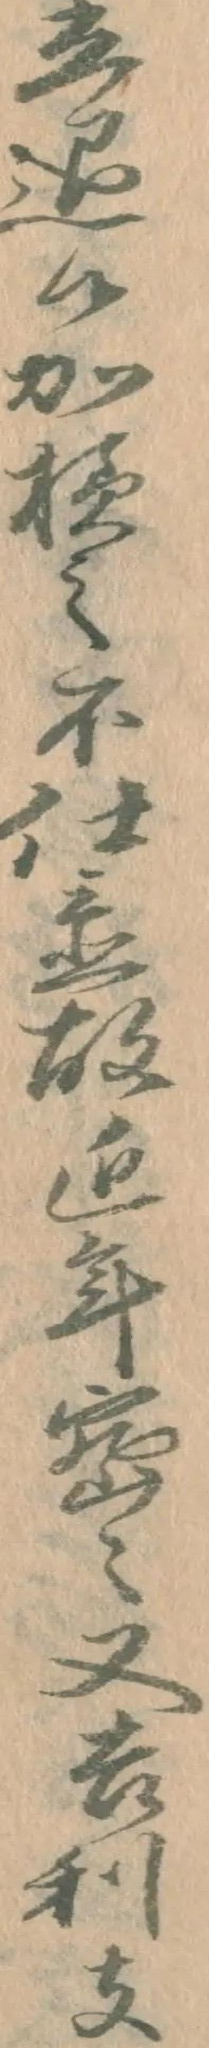立退候加様之不仕置故近年密々又吉利支
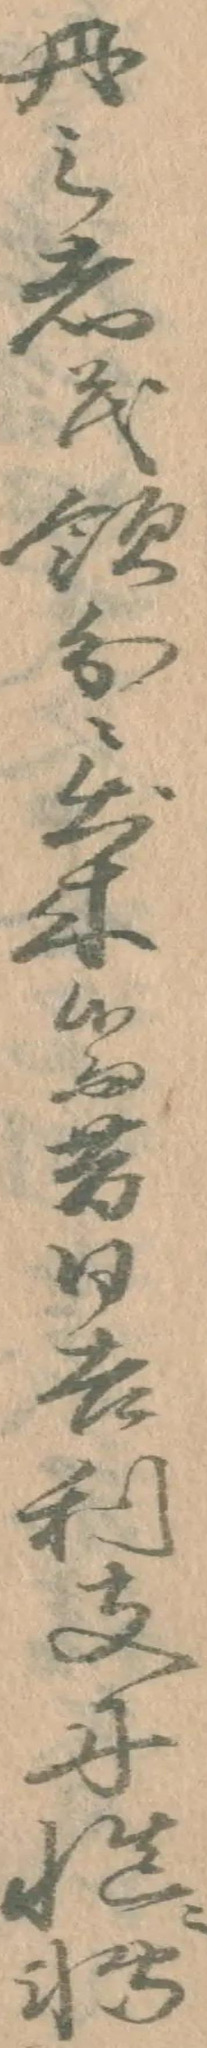丹之者も領分に出来候而昔日吉利支丹慥に転
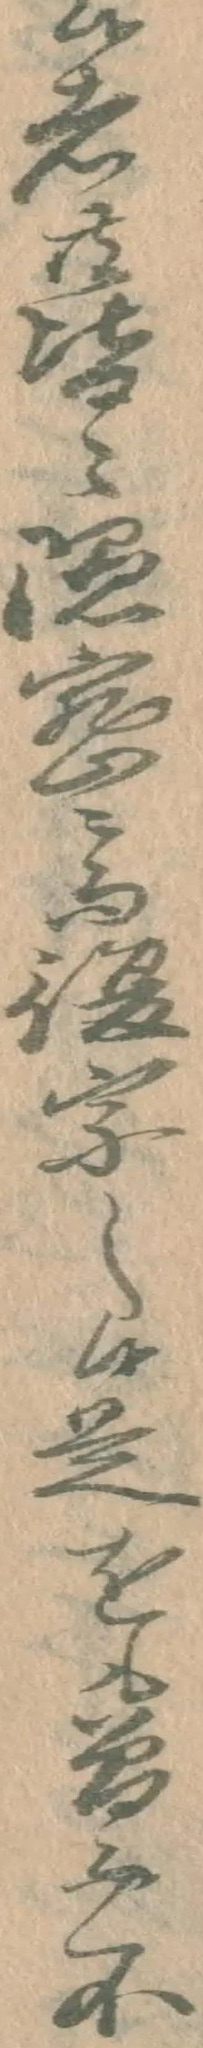候者共皆々隠密に而復宗し候是をも曽而不
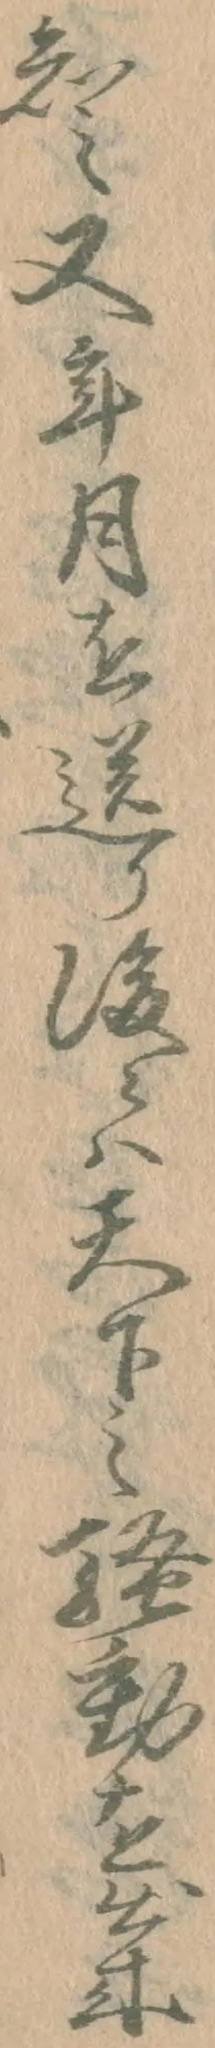知之又年月を送り後には天下之騒動を出来
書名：切支丹御退治記 49巻. [1]
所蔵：国立国会図書館 National Diet Library, JAPAN
